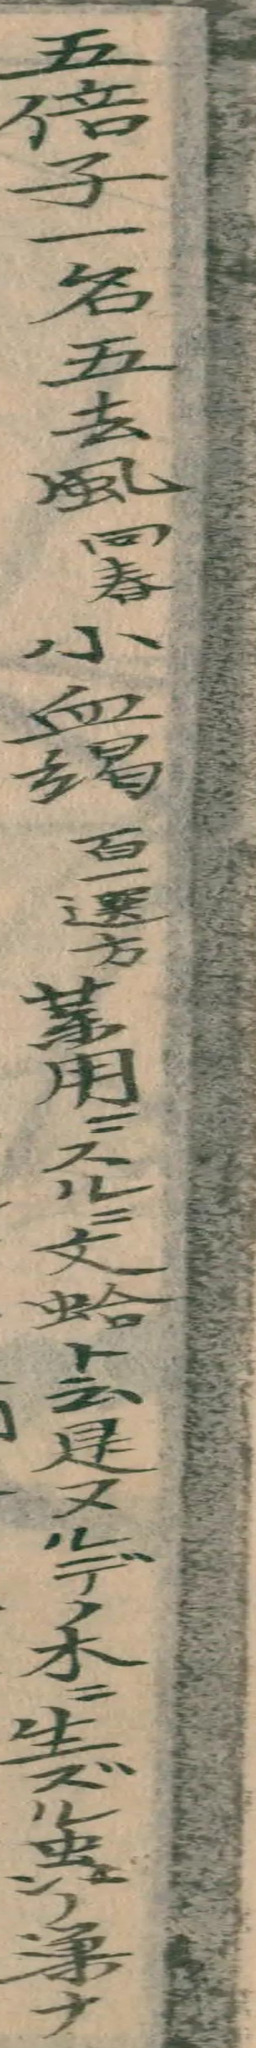五倍子一名五去風回春小血竭百一選方薬用ニスルニ文蛤ト云是ヌルデノ木ニ生ズル蟲ノ巣ナ
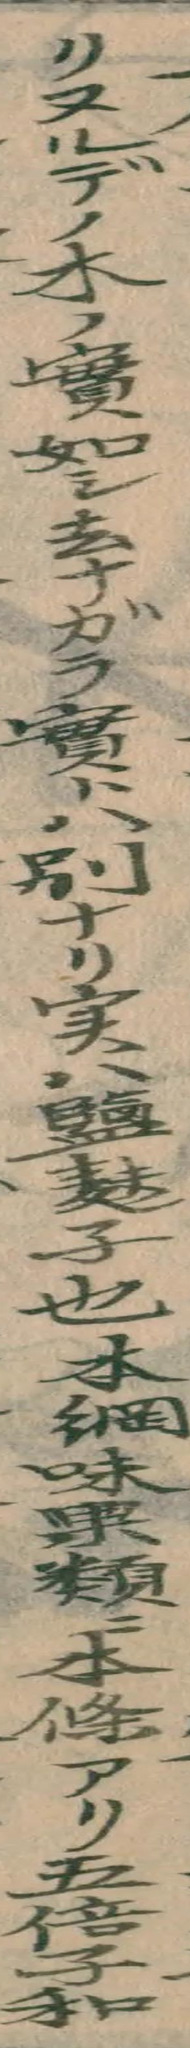リヌルデノ木ノ實如シ去ナガラ實トハ別ナリ実ハ鹽麩子也本綱味果類ニ本條アリ五倍子和
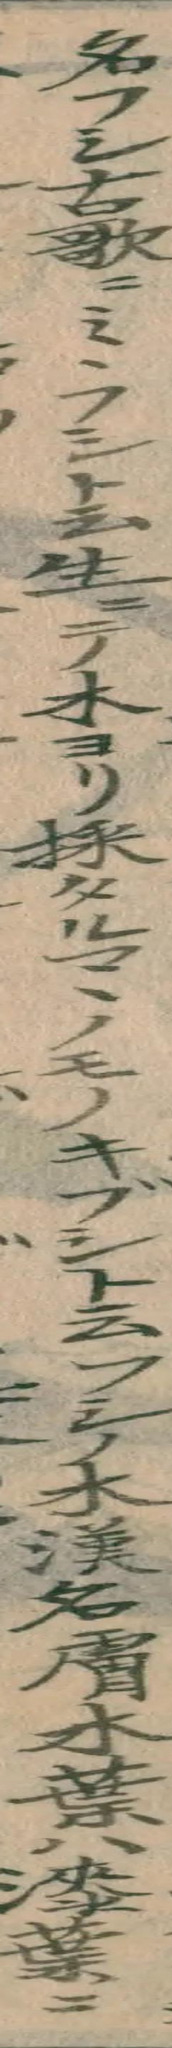名フシ古歌ニミヽフシト云生ニテ木ヨリ採タルマヽノモノキブシト云フシノ木漢名膚木葉ハ漆葉ニ
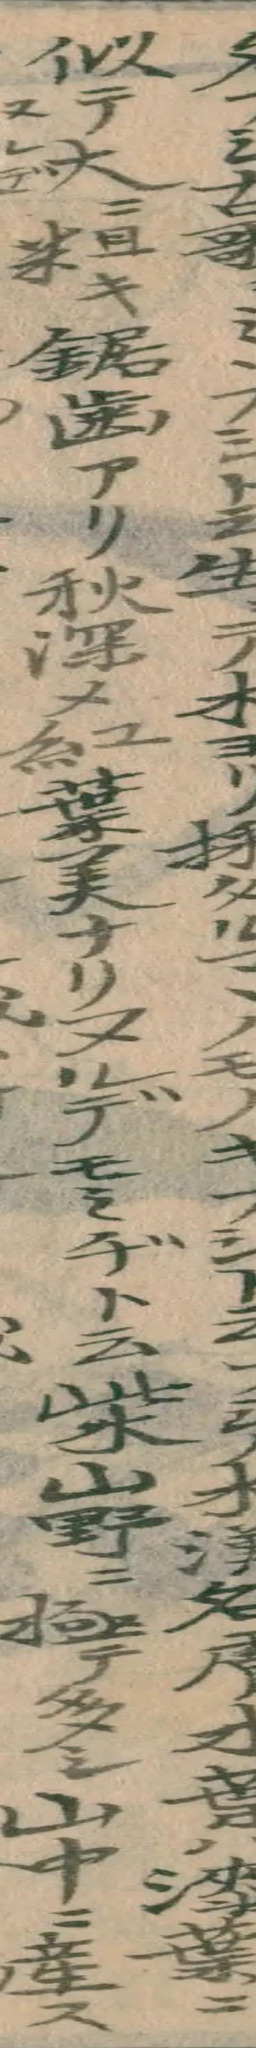似テ大ニ粗キ鋸歯アリ秋深シテ紅葉美ナリヌルデモミヂト云此木山野ニ極テ多シ山中ニ産ス
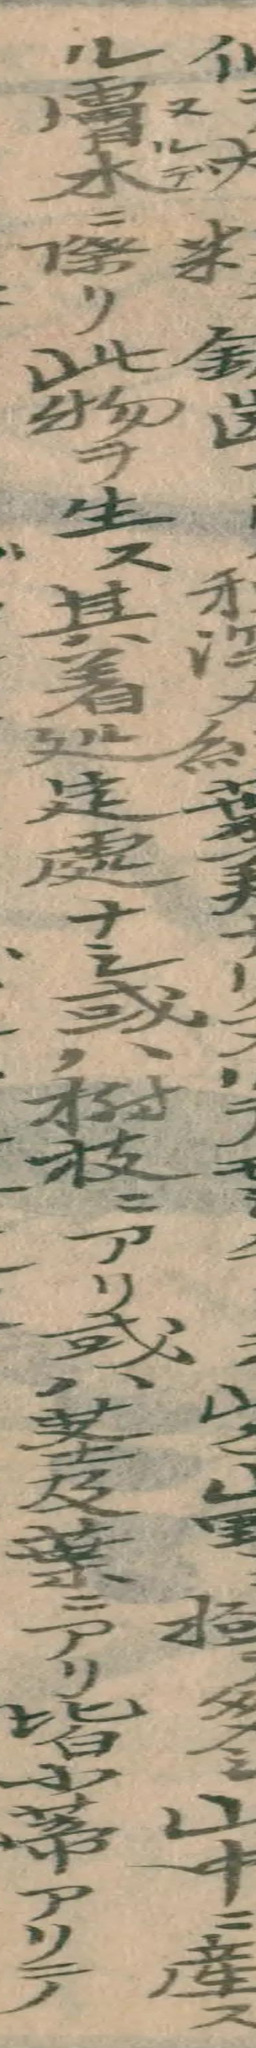ル膚木ニ際リ此物ヲ生ス其着処定處ナシ或ハ樹枝ニアリ或ハ茎及葉ニアリ皆小蒂アリテ
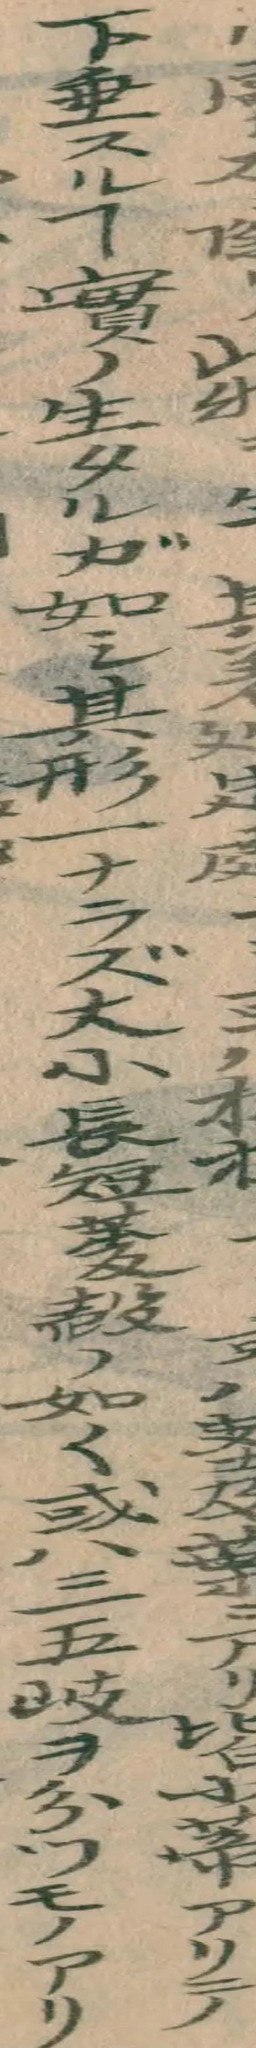下垂スルコト實ノ生タルガ如シ其形一ナラズ大小長短菱殻ノ如く或ハ三五岐ヲ分ツモノアリ
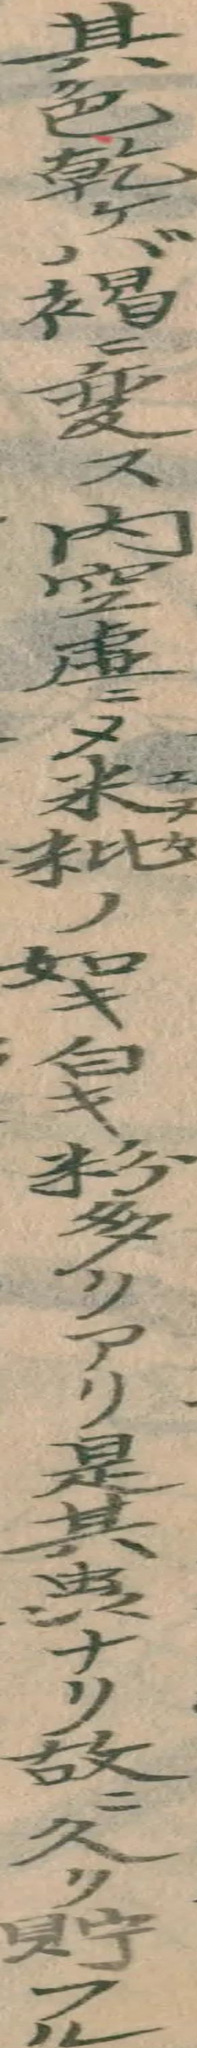其色・乾ケバ褐ニ変ス内空虚ニシテ米粃ノ如キ白キ粉多クアリ是其蟲ナリ故ニ久ク貯フル
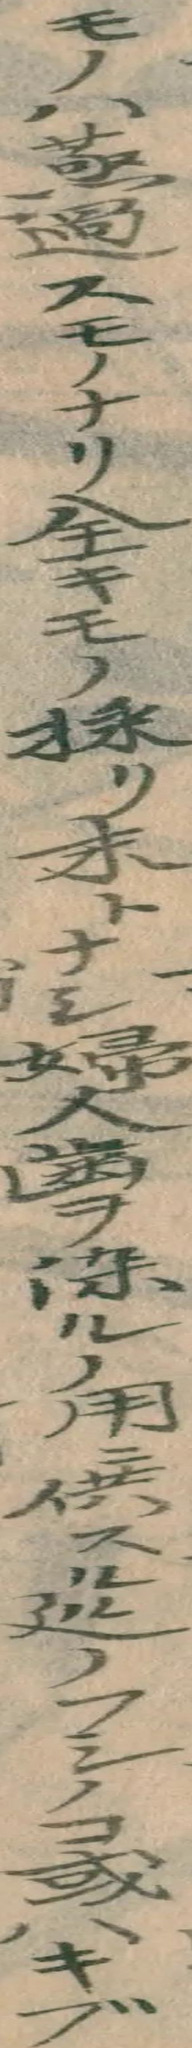モノハ蒸過スモノナリ全キモノ採リ末トナシ婦人歯ヲ染ルノ用ニ供スル処ノフシノコ或ハキブ
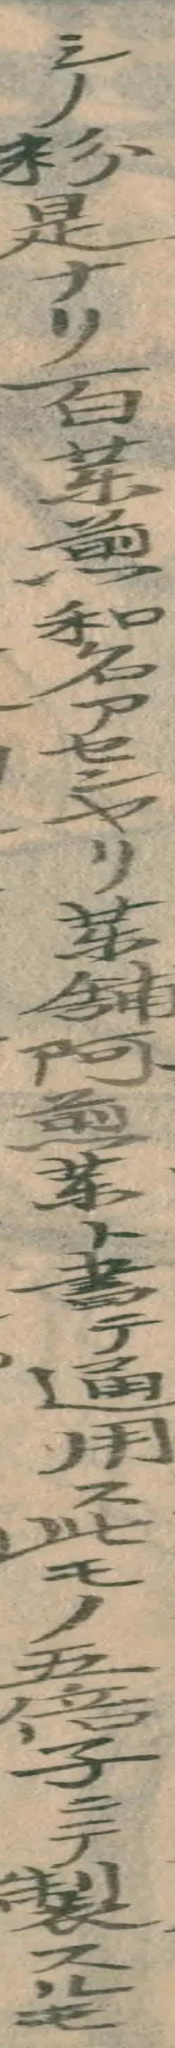シノ粉是ナリ百薬煎和名アセンヤク薬舗阿煎薬ト書テ通用ス此モノ五倍子ニテ製スルモ
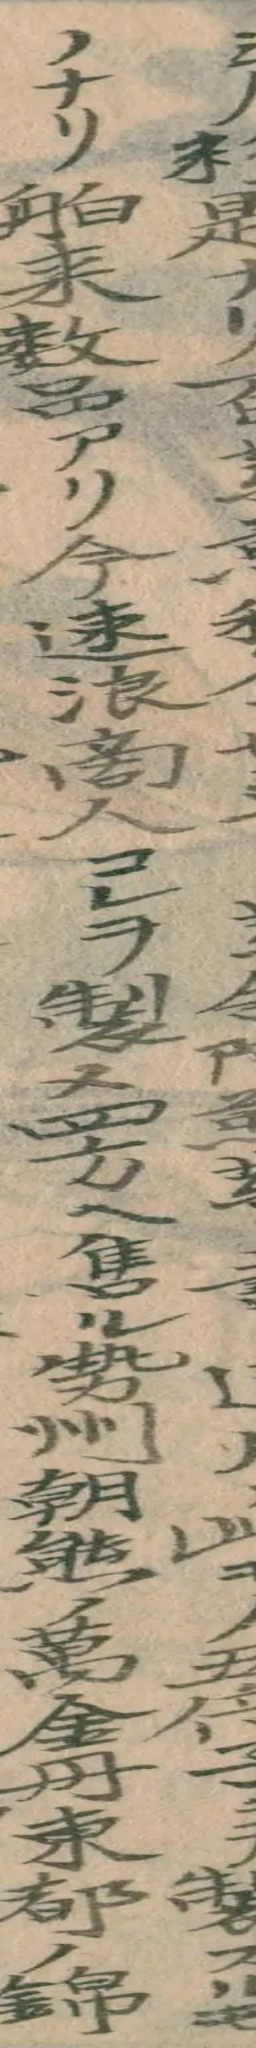ノナリ舶来数品アリ今速浪商人コレヲ製シテ四方ヘ售ル勢州朝熊ノ萬金丹東都ノ錦
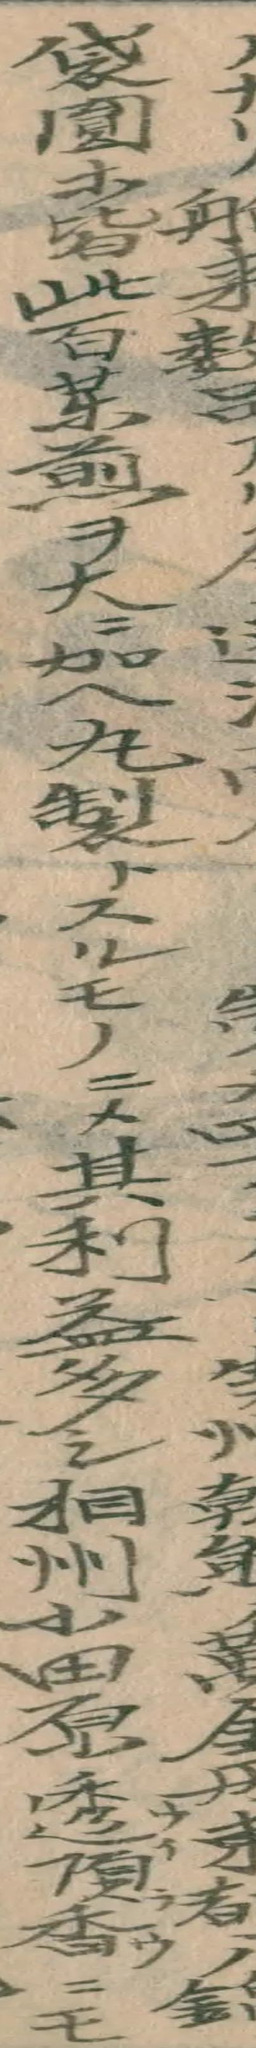袋圓等皆此百薬煎ヲ大ニ加ヘ丸製トスルモノニシテ其利益多シ相州小田原透頂香ニモ
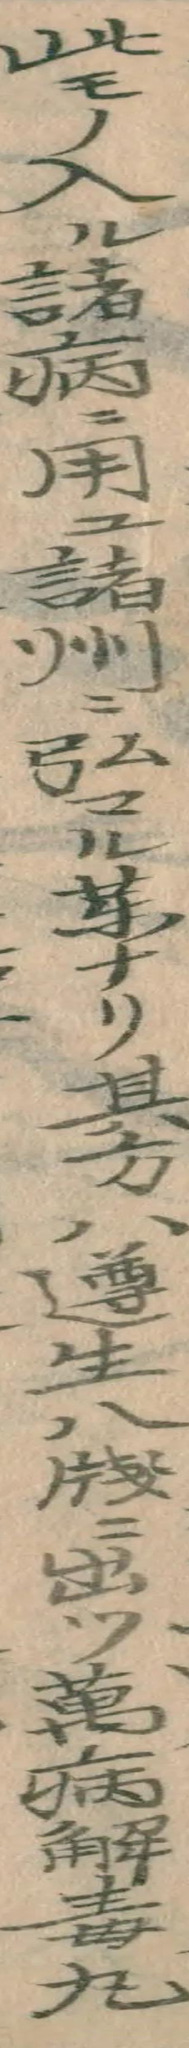此モノ入ル諸病ニ用ユ諸州ニ弘マル薬ナリ其方ハ遵生八牋ニ出ツ萬病解毒丸
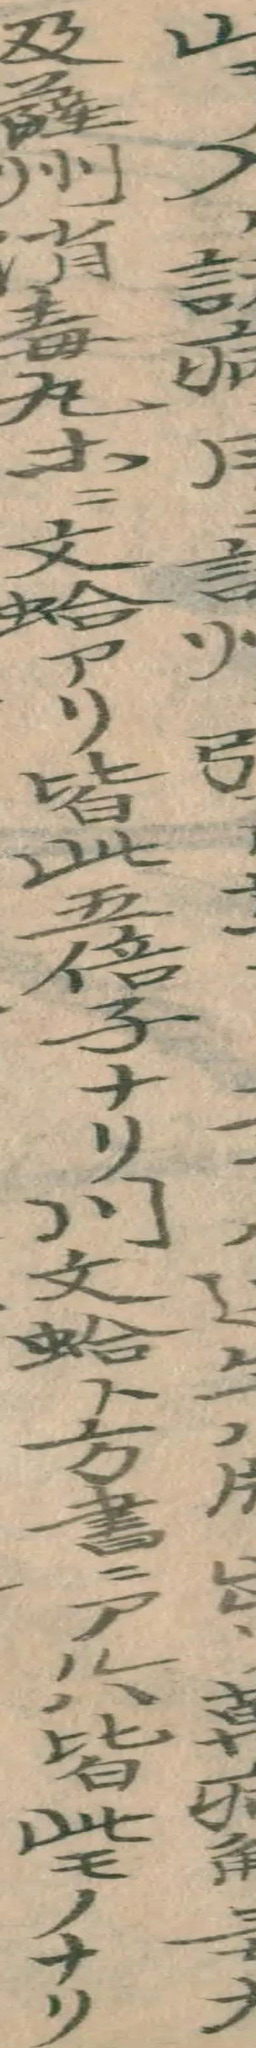及薩州消毒丸等ニ文蛤アリ皆此五倍子ナリ川文蛤ト方書ニアルハ皆此モノナリ
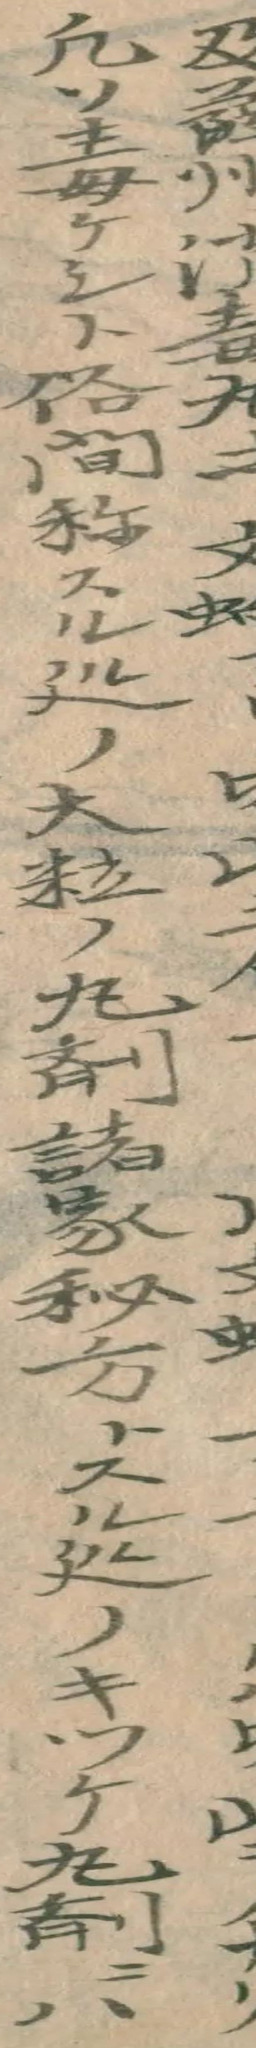凡ソ毒ケシト俗間称スル処ノ大粒ノ丸剤諸家秘方トスル処ノキツケ丸剤ニハ
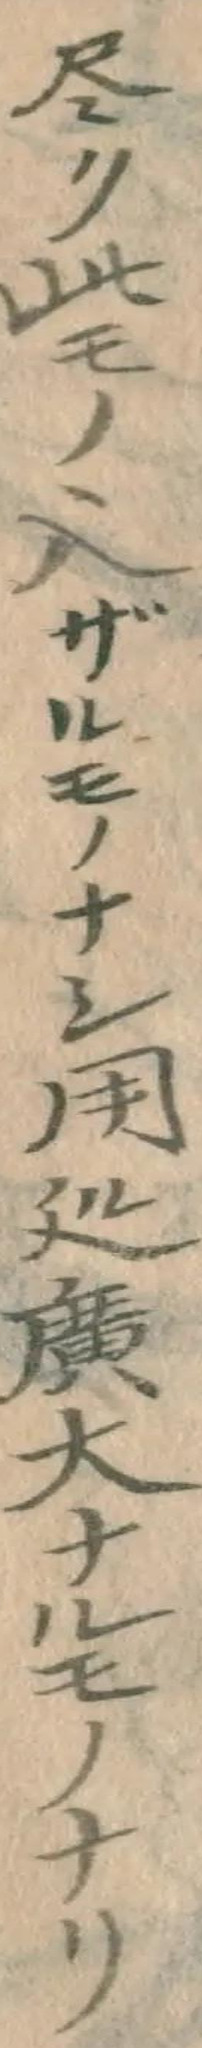尽ク此モノヽ入ザルモノナシ用処廣大ナルモノナリ

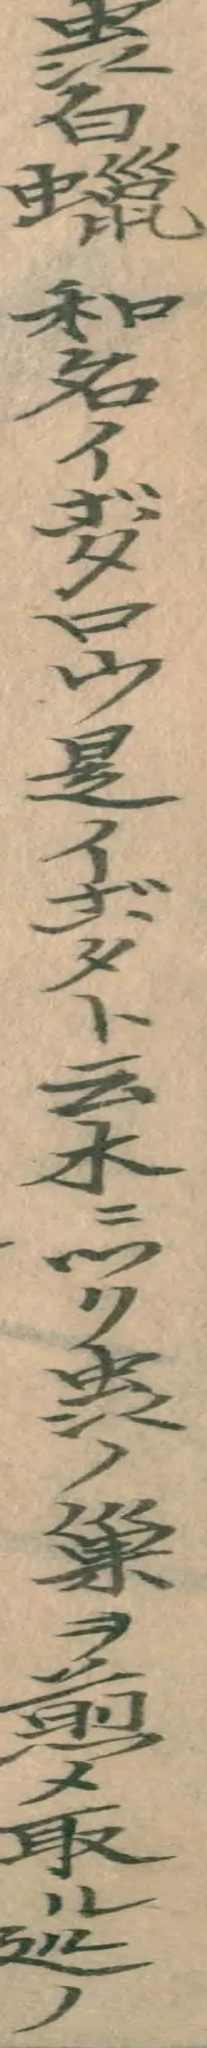蟲白蠟和名イボタロウ是イボタト云木ニツク蟲ノ巢ヲ煎シテ取ル処ノ
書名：千蟲譜 3巻. [1]
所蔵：国立国会図書館 National Diet Library, JAPAN
